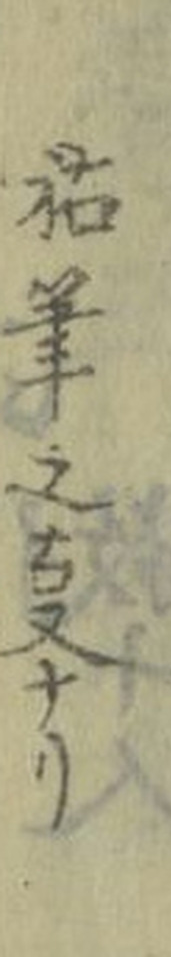祐筆之㕝ナリ
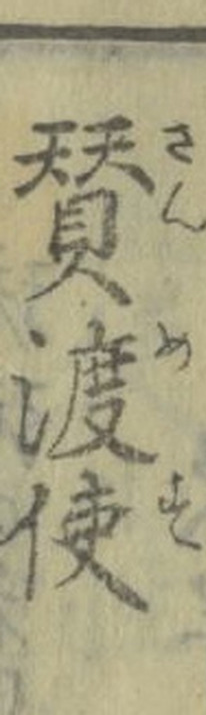賛渡使
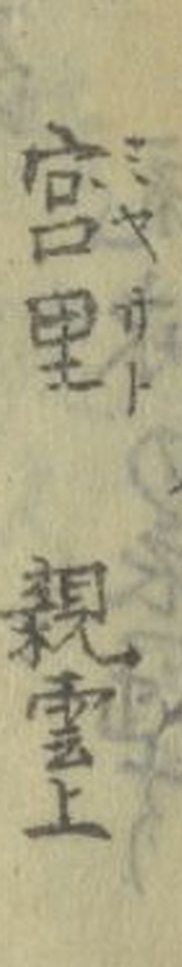宮里親雲上
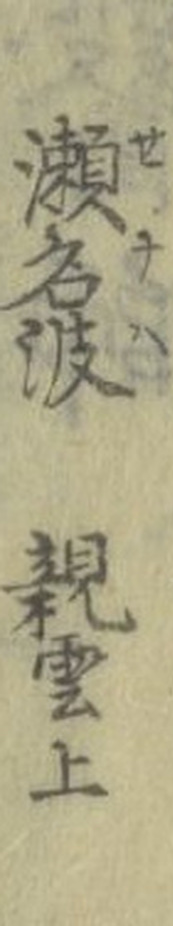瀬名波親雲上
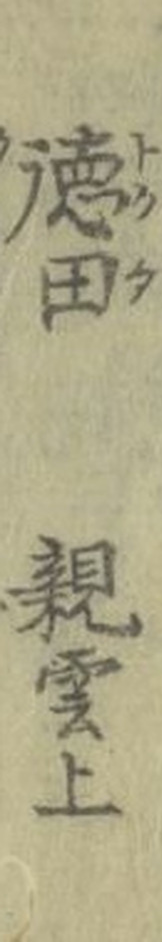徳田親雲上
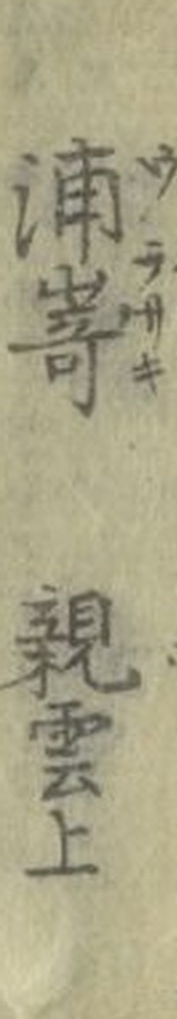浦嵜親雲上
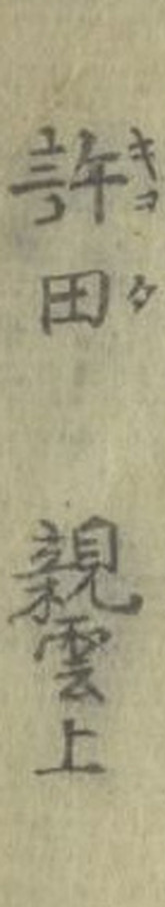許田親雲上

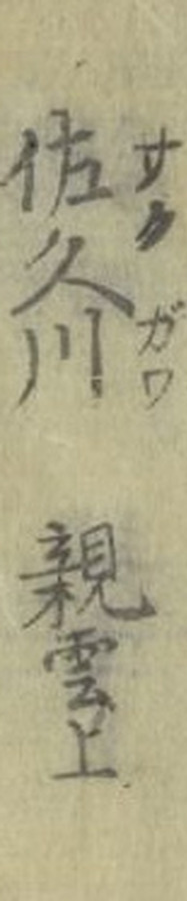佐久川親雲上
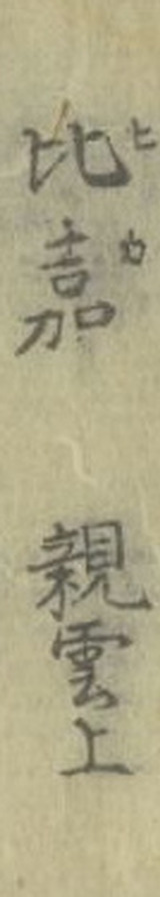比嘉親雲上
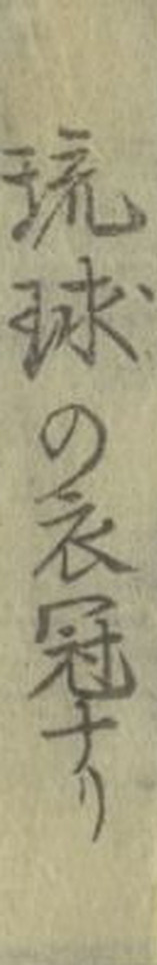琉球の衣冠ナリ
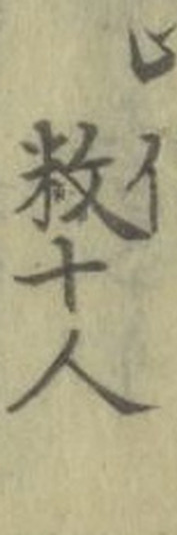数十人
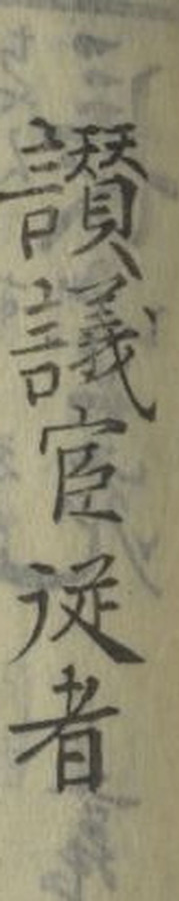讃議宦従者
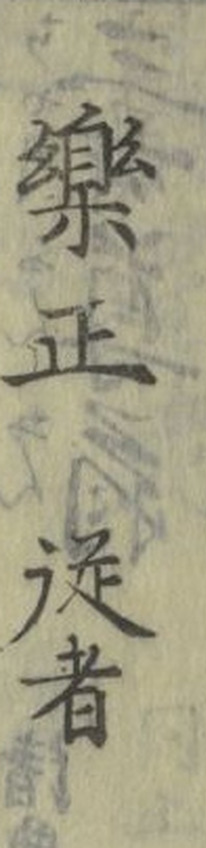樂正従者
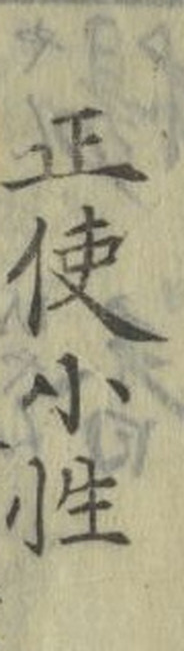正使小性
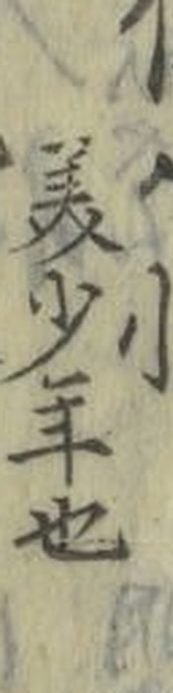美少年也
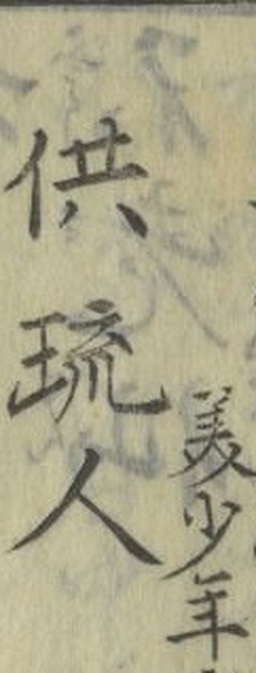供琉人
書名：琉球人行列記
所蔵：University of the Ryukyus Library
